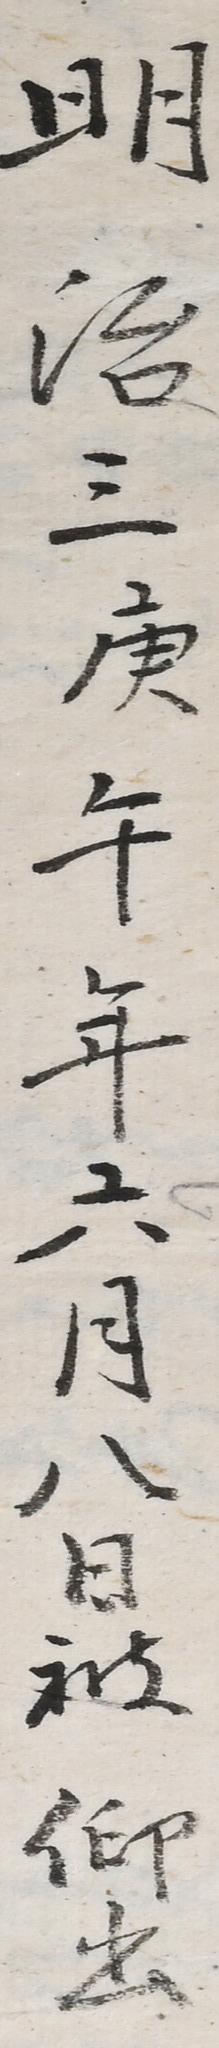明治三庚午年六月八日被仰出
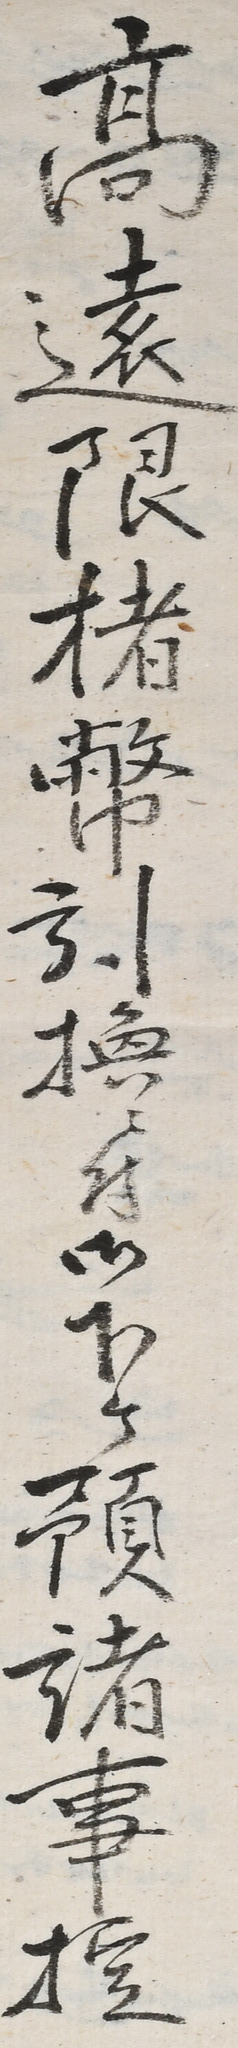高遠限楮幣引換ニ付御下ヶ預諸事控

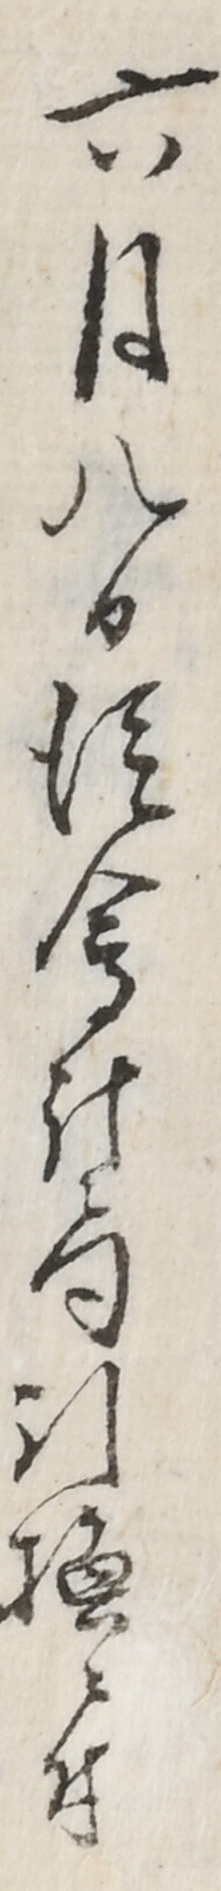六月八日従会計局引換ニ付
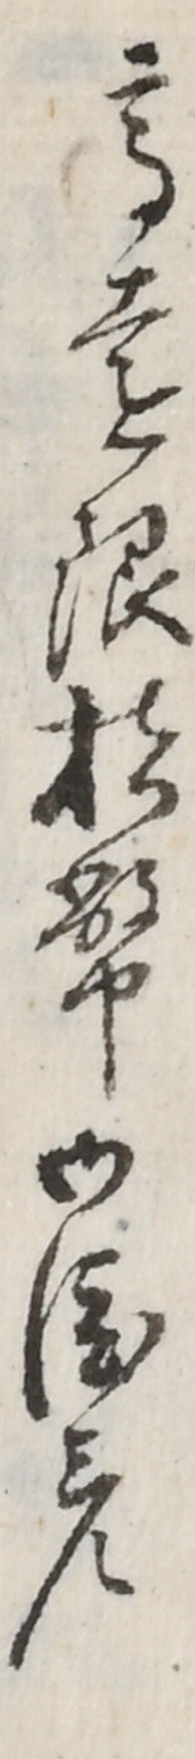高遠限楮幣御渡差
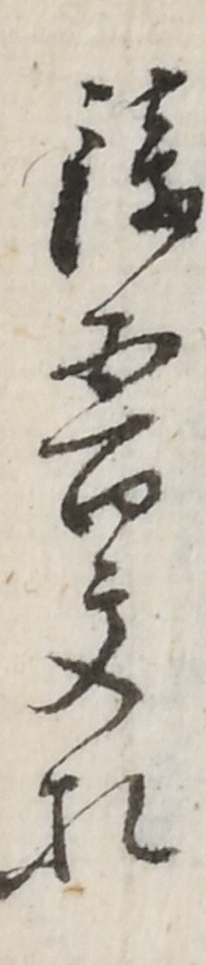銭五百文札
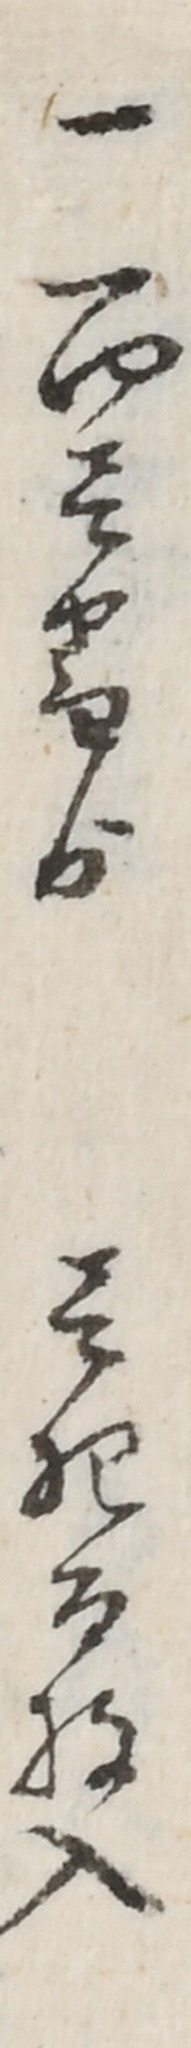一百壱番ゟ壱把百枚入
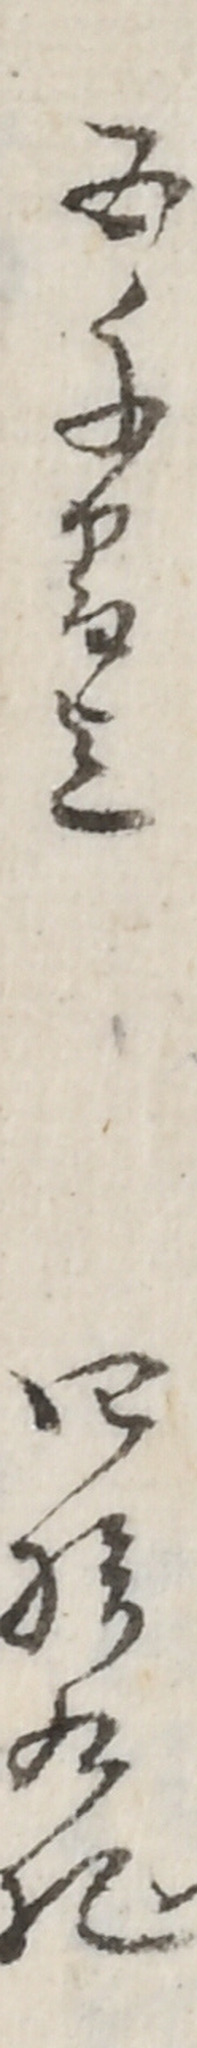五千番迄四拾九札
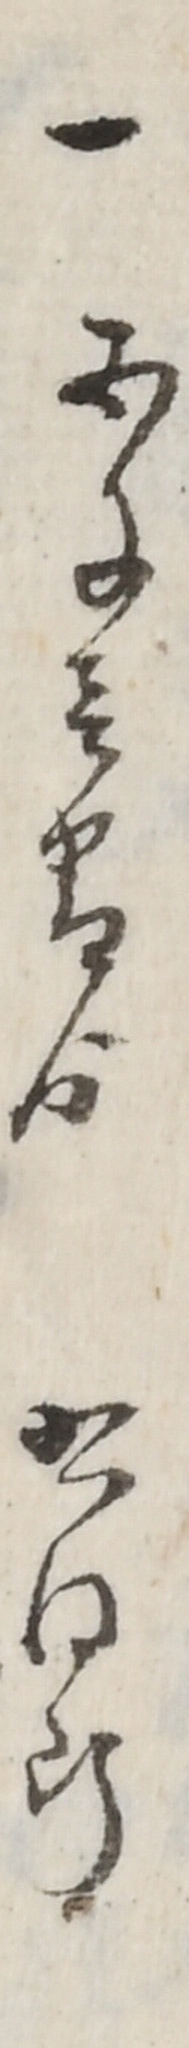一五千壱番ゟ右同断
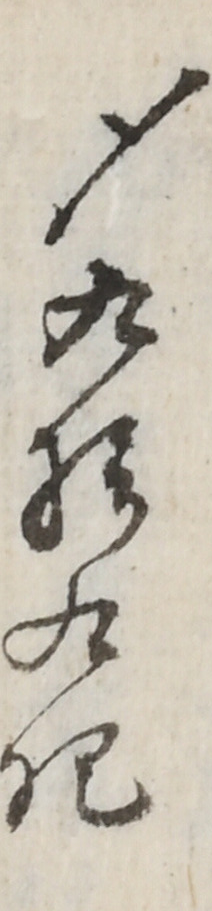〆九拾九把
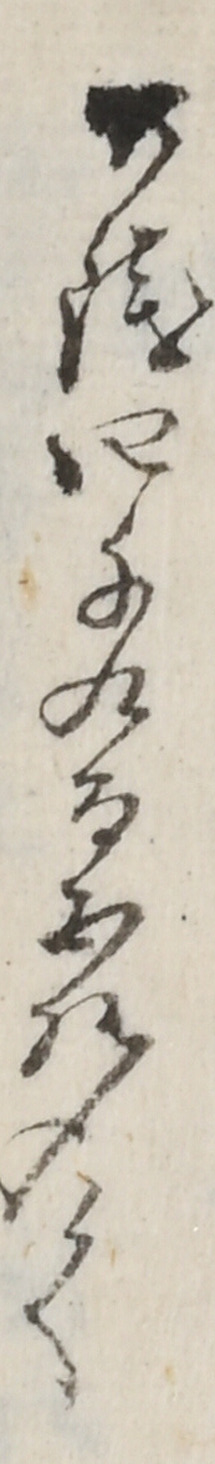此銭四千九百五拾〆文
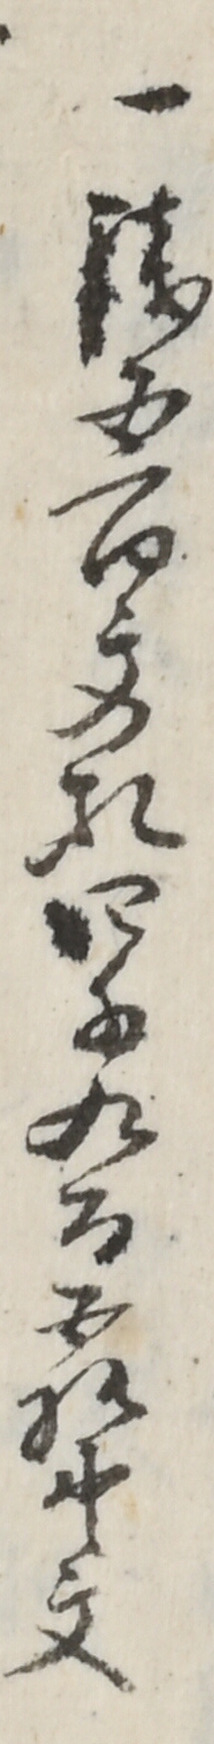一銭五百文札四千九百五拾貫文
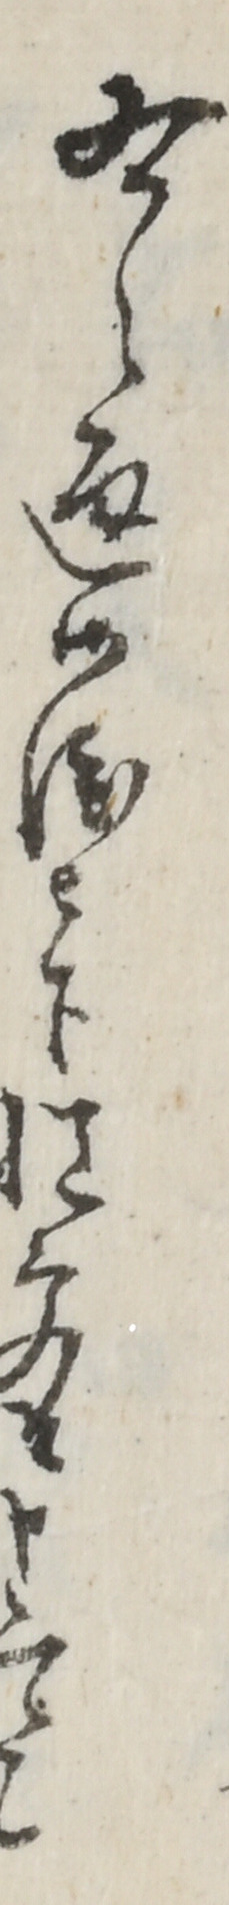右之通御渡被下慥受取申上候て

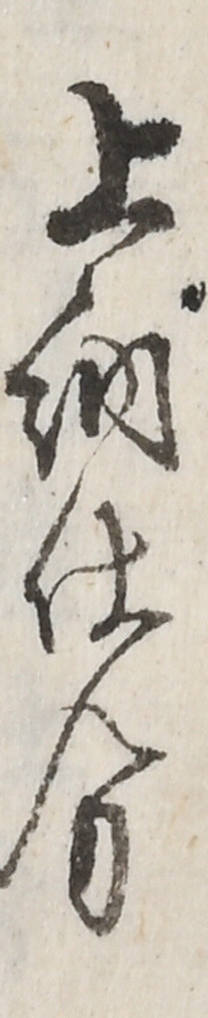上納仕分
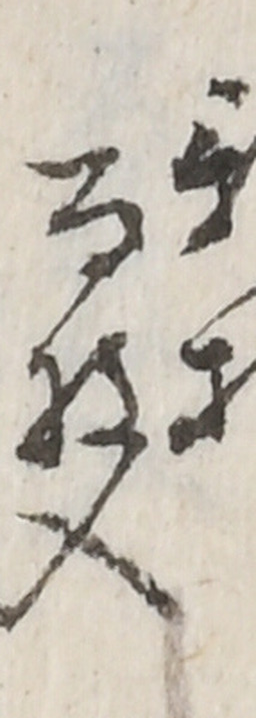百枚入
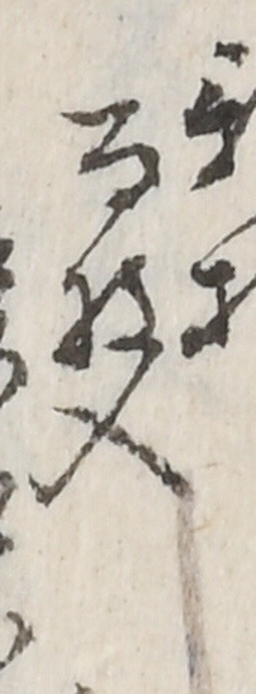百枚入
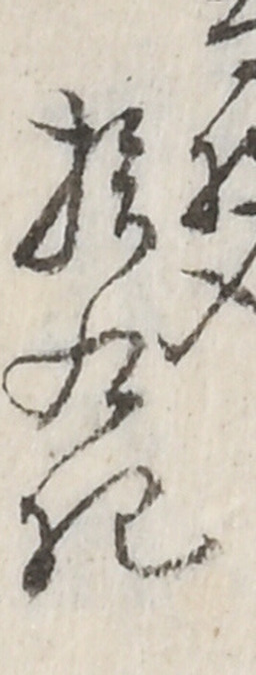拾九把
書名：髙遠限楮幣引換ニ付御下ケ預諸事控
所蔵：伊那市立高遠町図書館・合同会社AMANE
